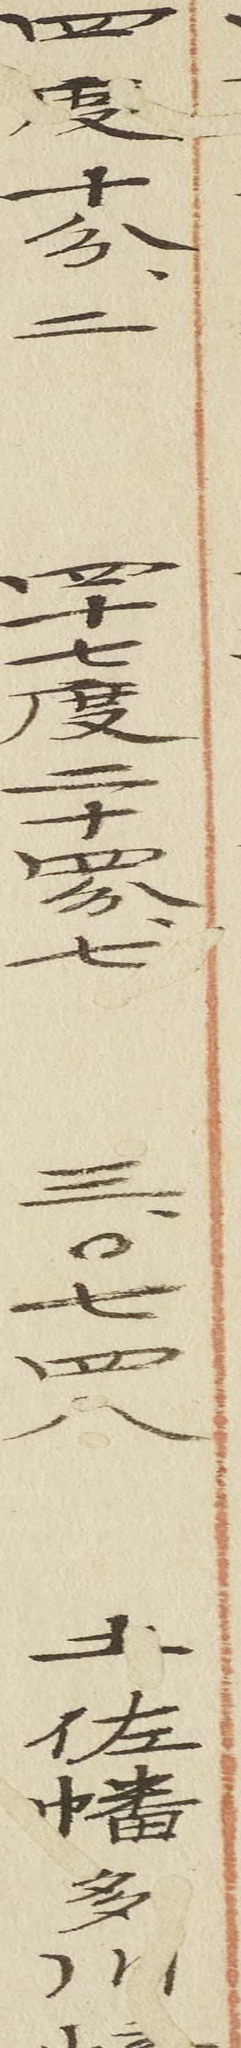四度十分、二四十七度二十四分、七三、〇七四八土佐幡多川崎
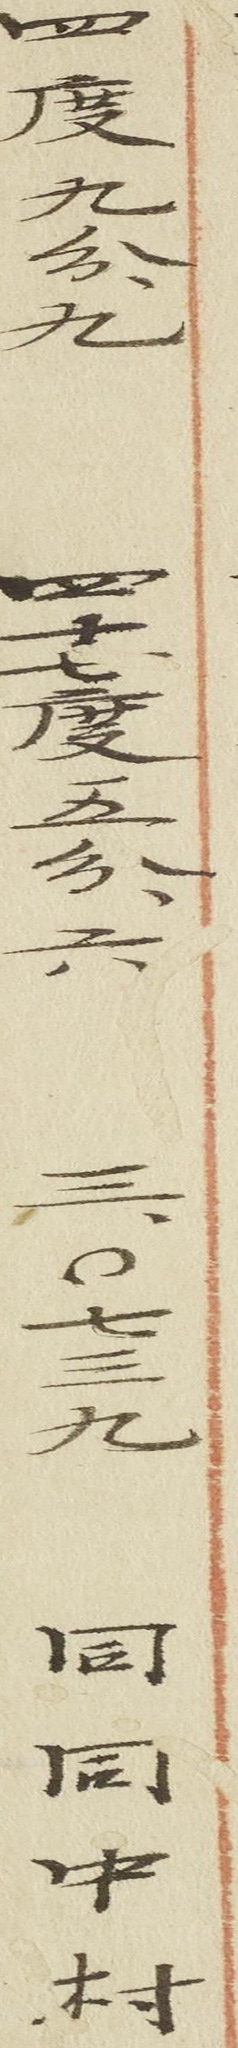四度九分、九四十七度五分、六三、〇七三九同同中村
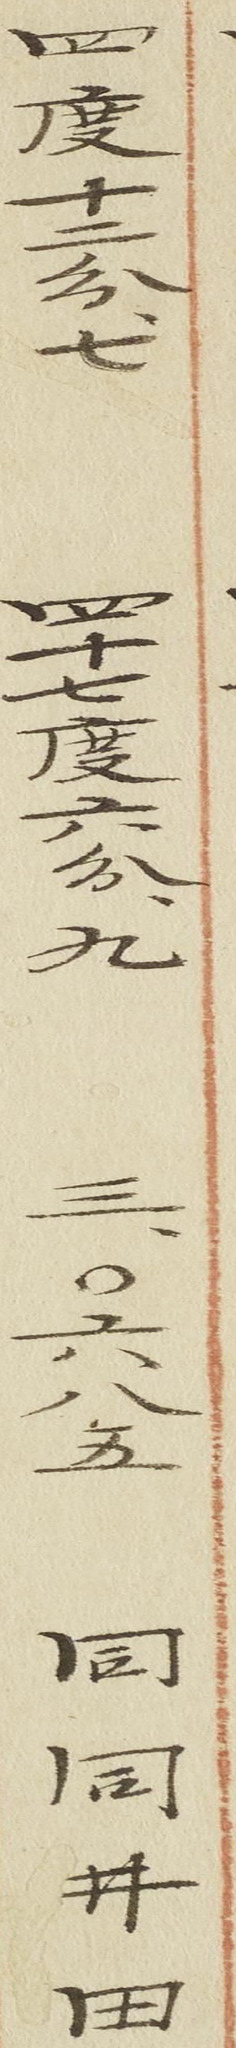四度十二分、七四十七度六分、九三、〇六八五同同井田
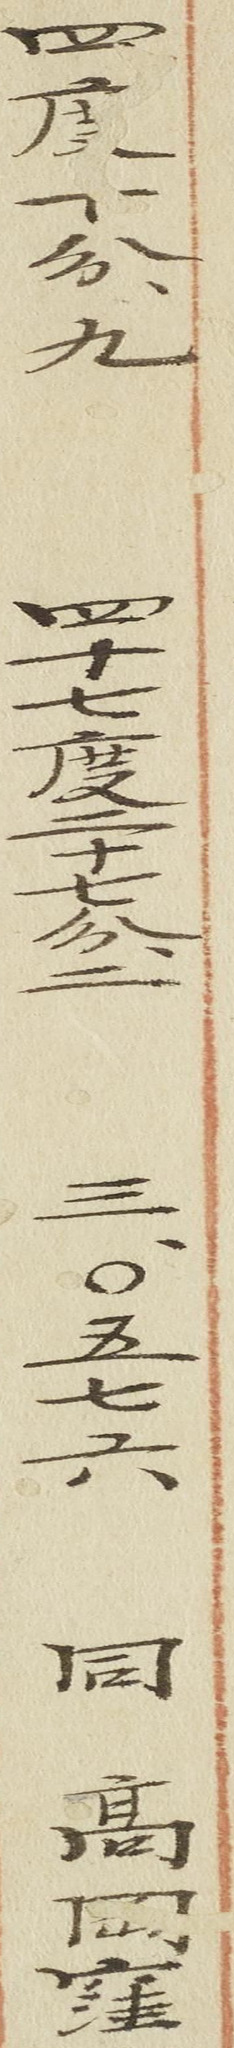四度十分、九四十七度二十七分、二三、〇五七六同高岡窪川
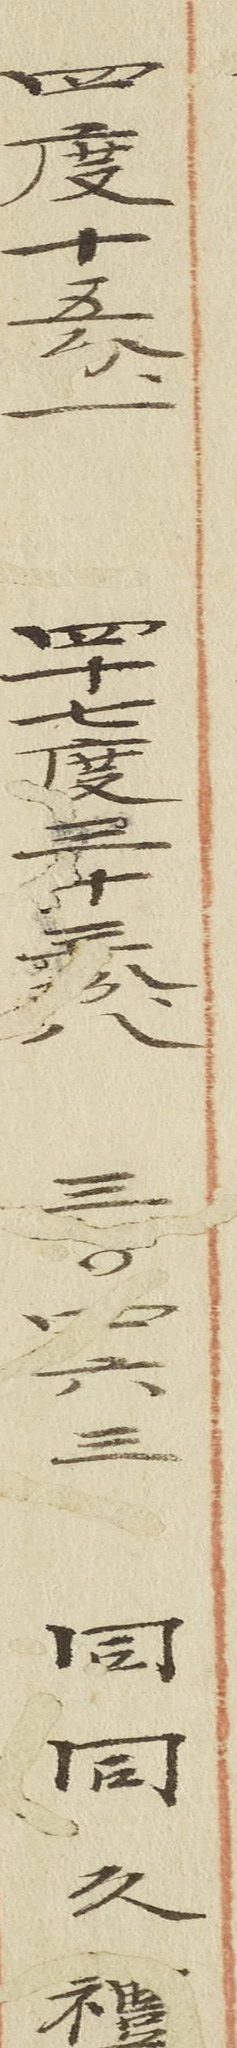四度十五分、一四十七度三十三分、八三、〇四六三同同久礼
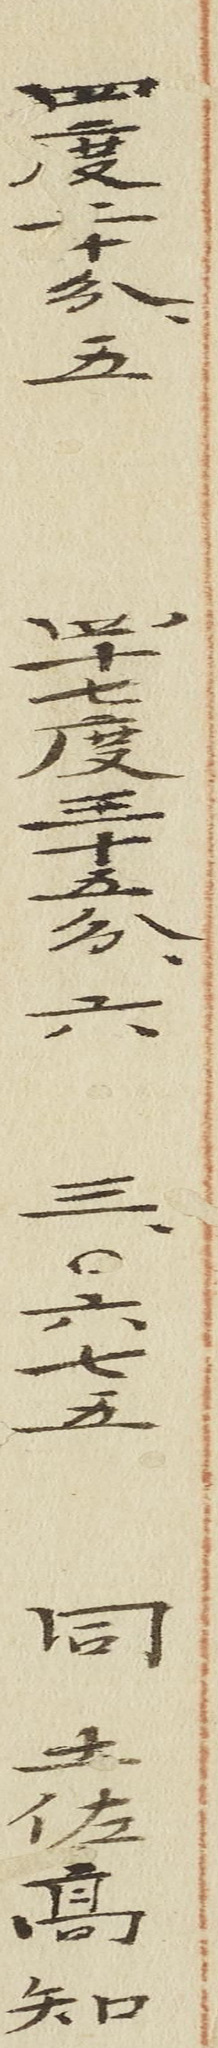四度二十分、五四十七度三十五分、六三、〇六七五同土佐高知
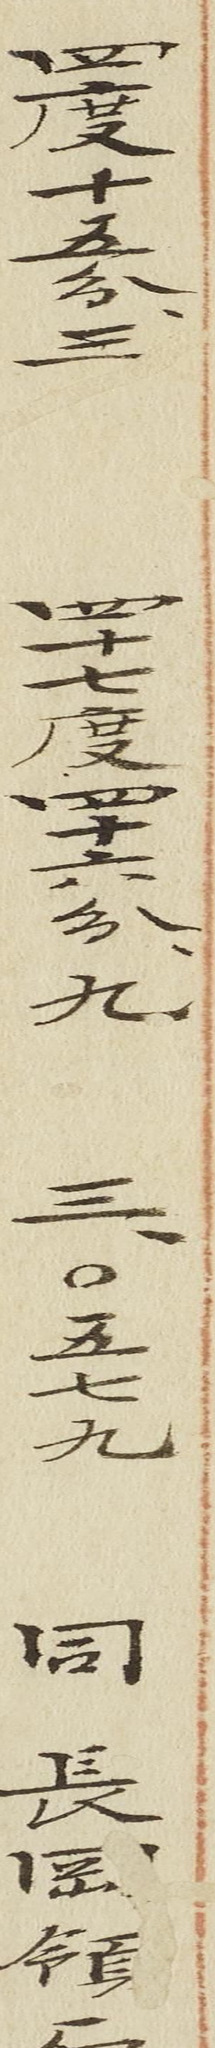四度十五分、三四十七度四十六分、九三、〇五七九同長岡領石
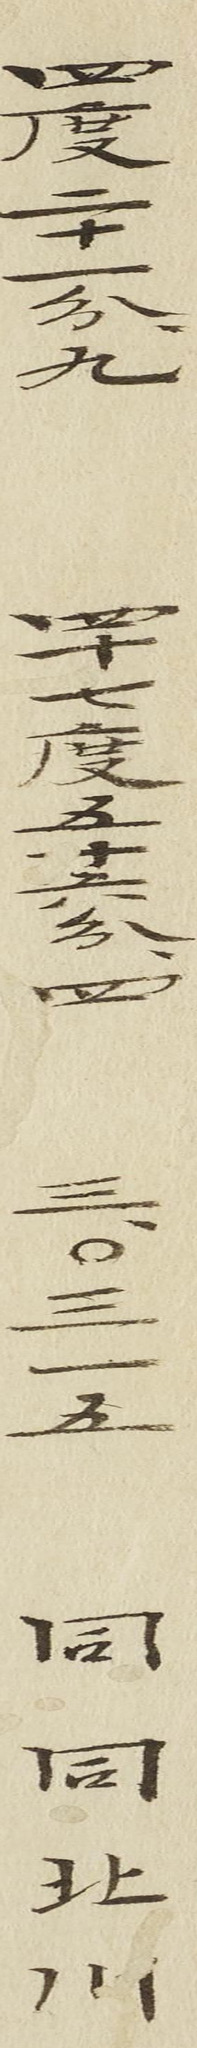四度二十一分、九四十七度五十六分、四三、〇三一五同同北川
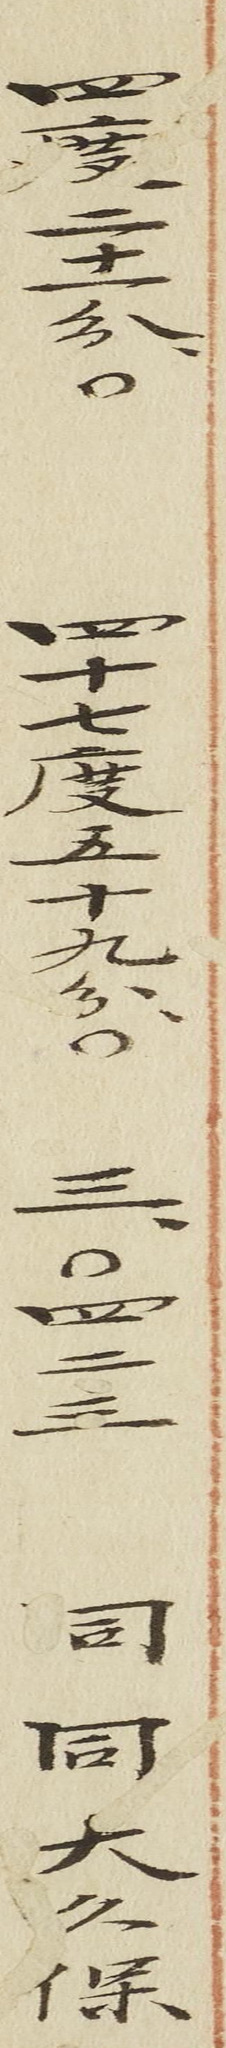四度二十一分、〇四十七度五十九分、〇三、〇四二三同同大久保
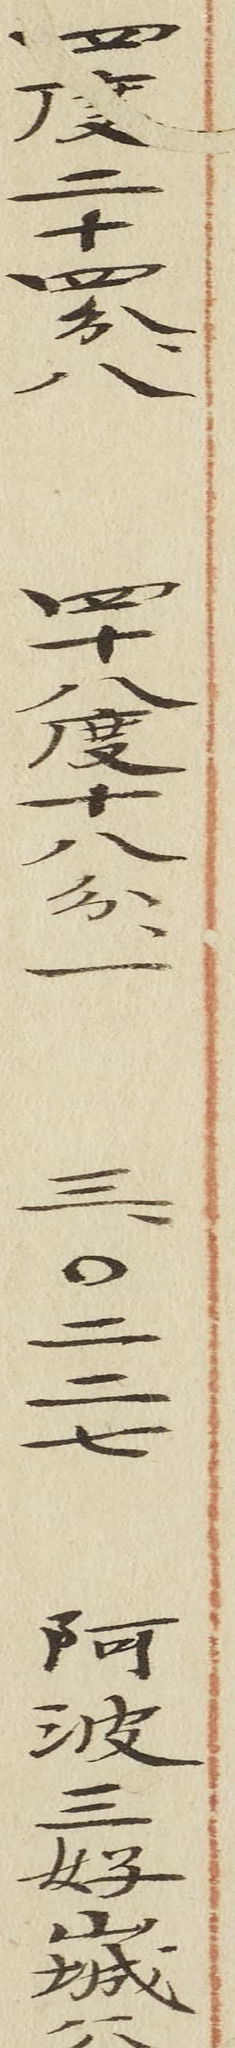四度二十四分、八四十八度十八分、一三、〇二二七阿波三好山城谷
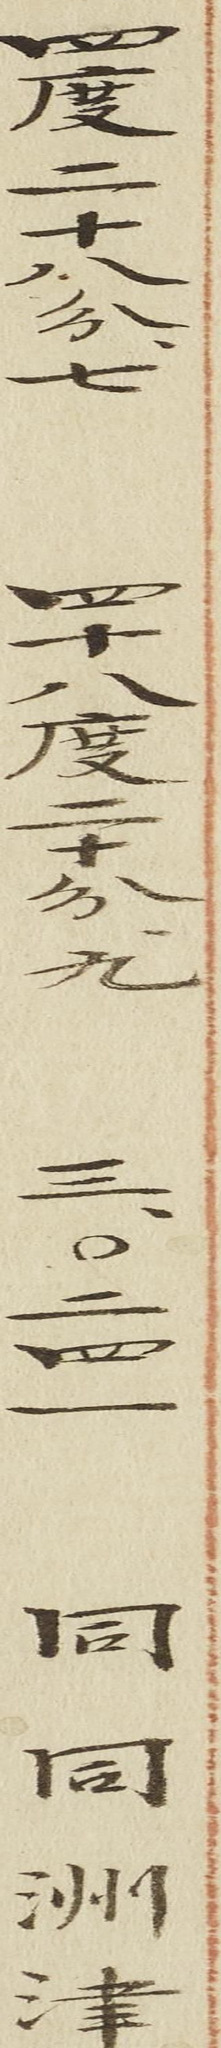四度二十八分、七四十八度二十分、九三、〇二四一同同州津
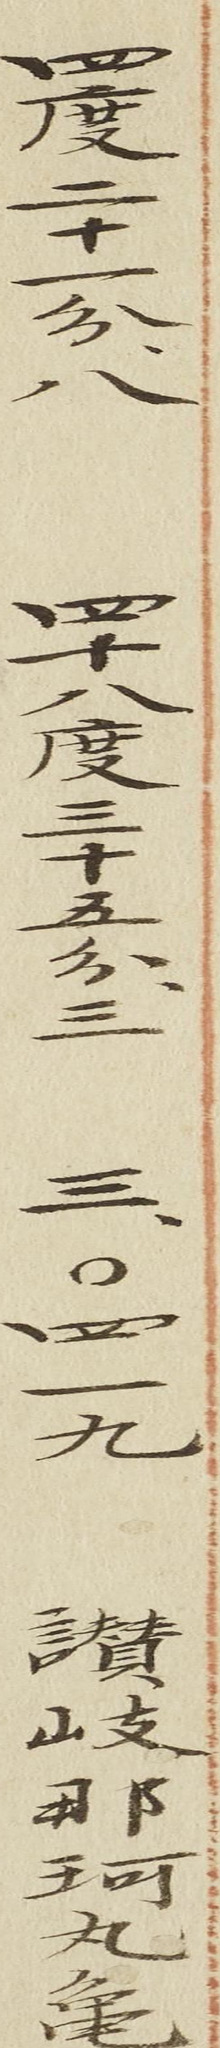四度二十一分、八四十八度三十五分、三三、〇四一九讃岐那珂丸亀
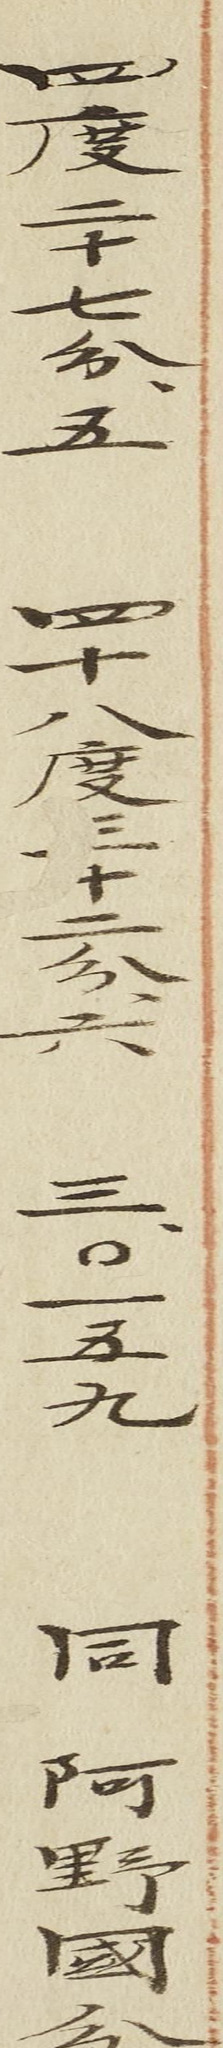四度二十七分、五四十八度三十二分、六三、〇一五九同阿野国分
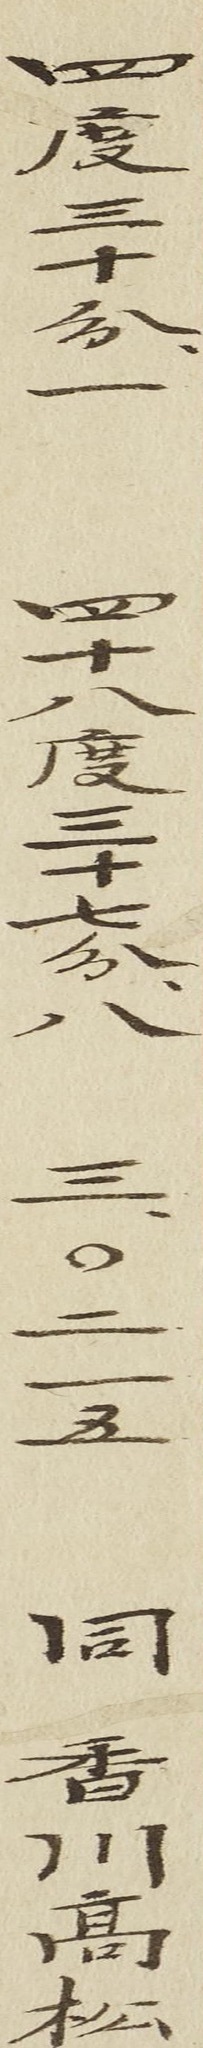四度三十分、一四十八度三十七分、八三、〇二一五同香川高松
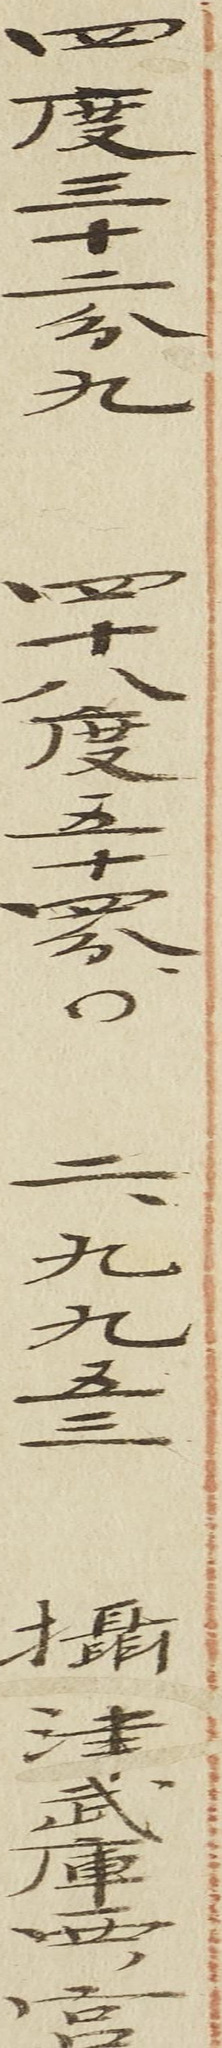四度三十二分、九四十八度五十四分、〇二、九九五三摂津武庫西ノ宮
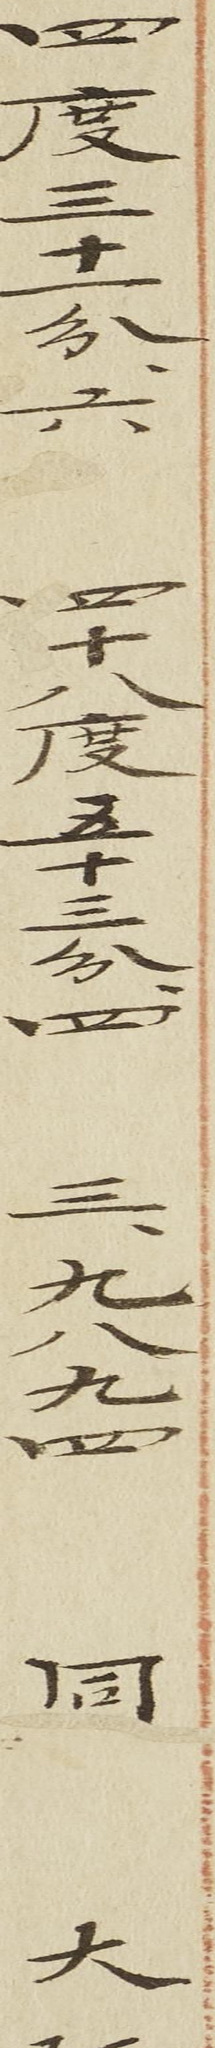四度三十一分、六四十八度五十三分、四三、九八九四同大阪
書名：鑷力観測報告
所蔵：東京大学地震研究所図書室 Earthquake Research Institute Library, The University of Tokyo, JAPAN
